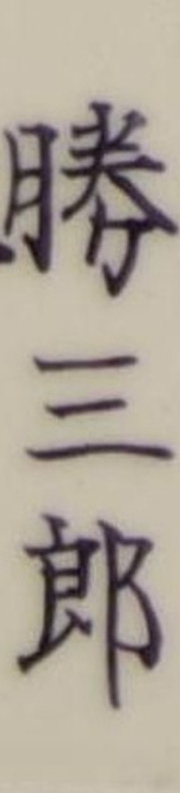勝三郎
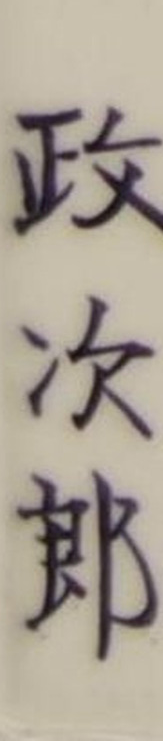政次郎

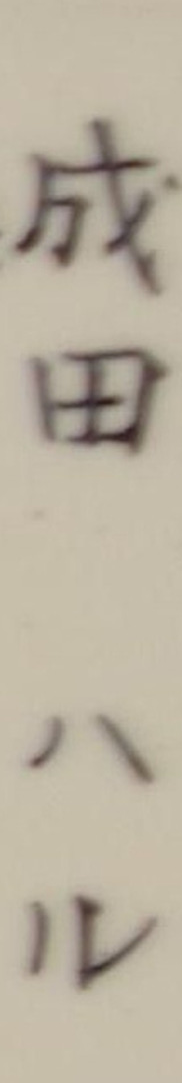成田ハル
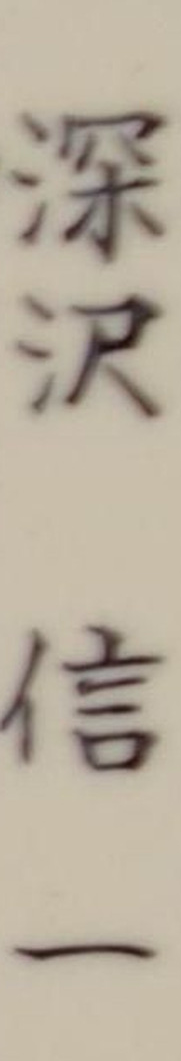深沢信一
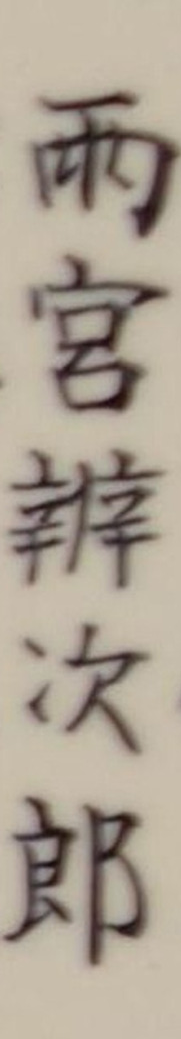両宮辨次郎
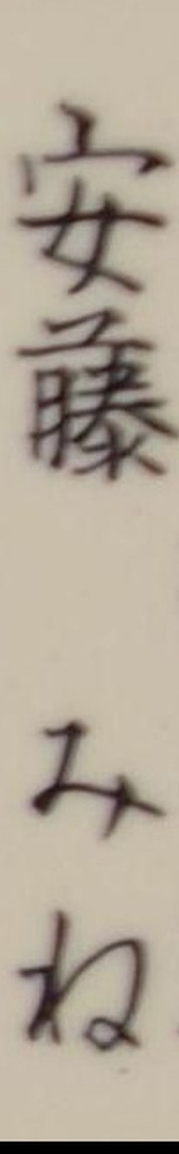安藤みね
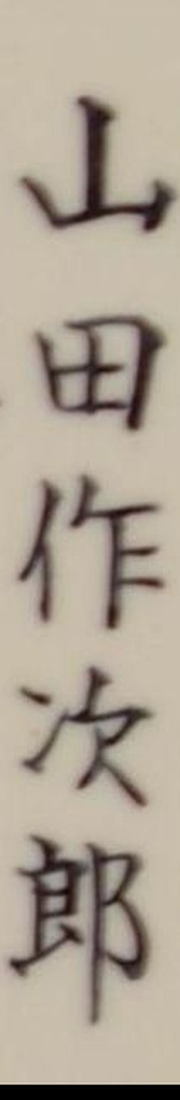山田作次郎
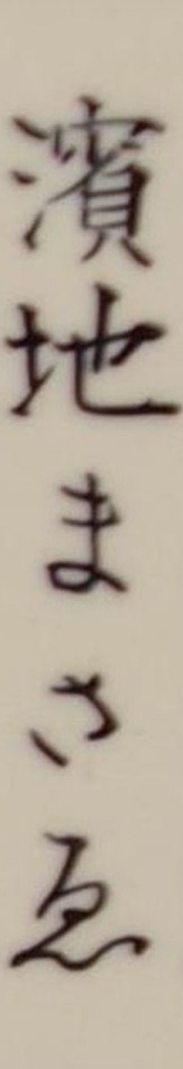濱地まさゑ
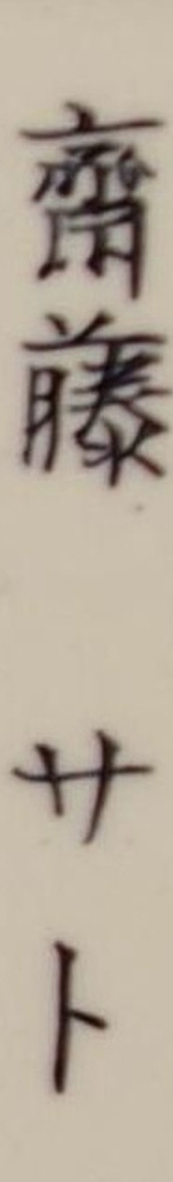斎藤サト
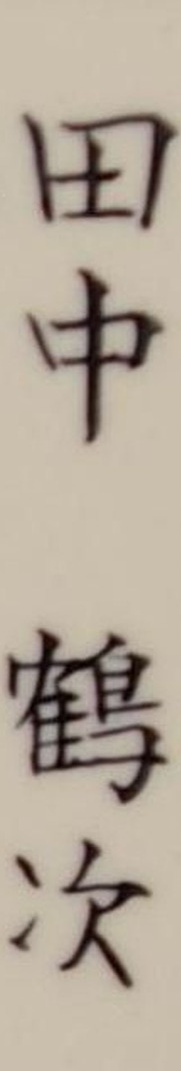田中鶴次
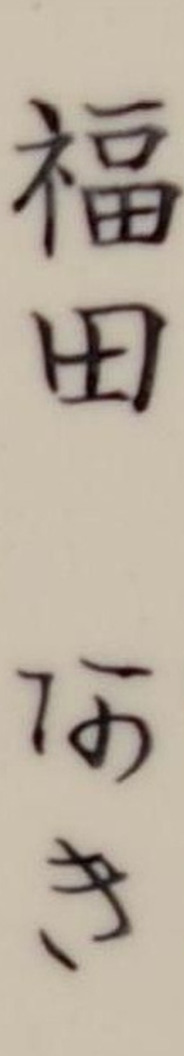福田あき
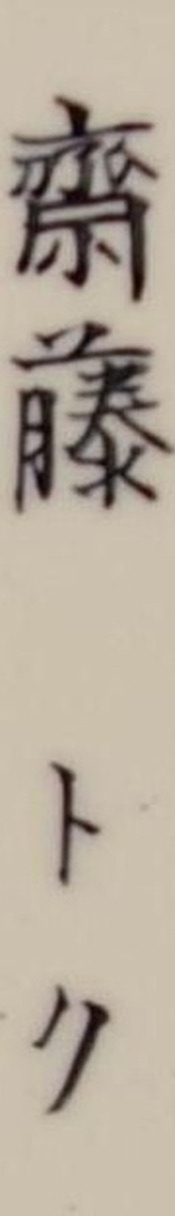斎藤トク
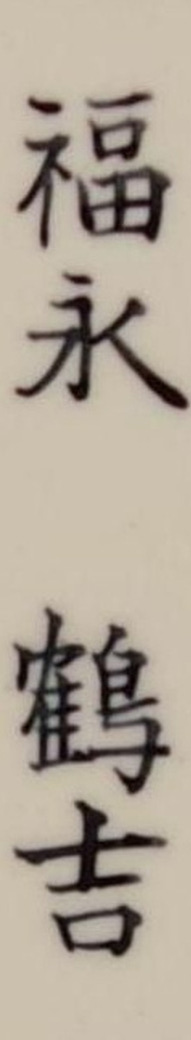福永鶴吉
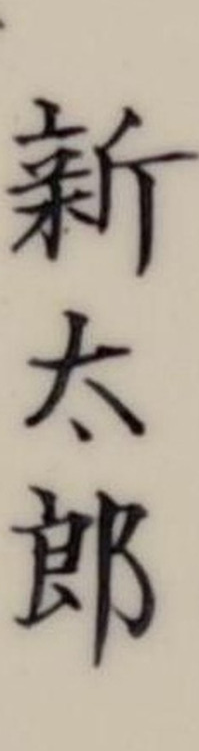新太郎
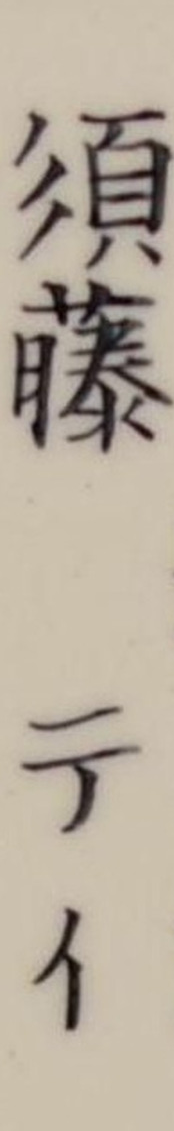須藤テイ
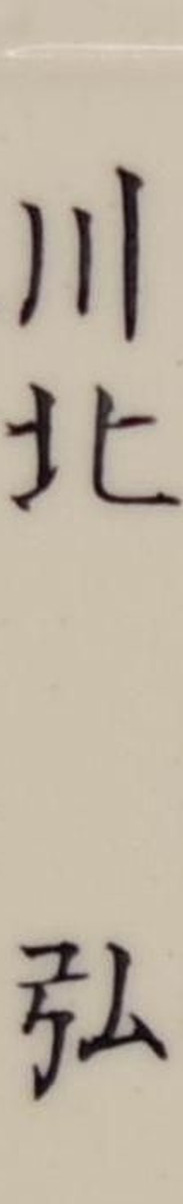川北弘
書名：M~S
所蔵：高野山金剛峯寺
